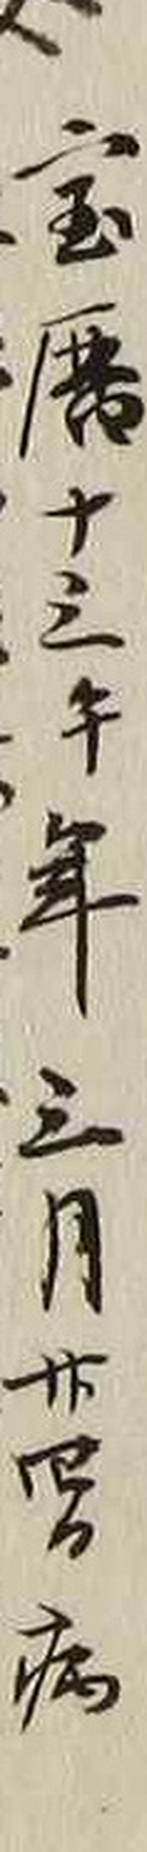宝暦十三午年三月廿四日病
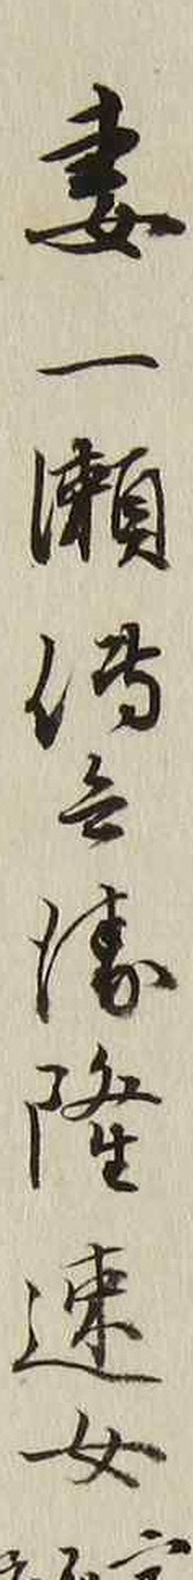妻一ノ瀬伝兵衛隆足女
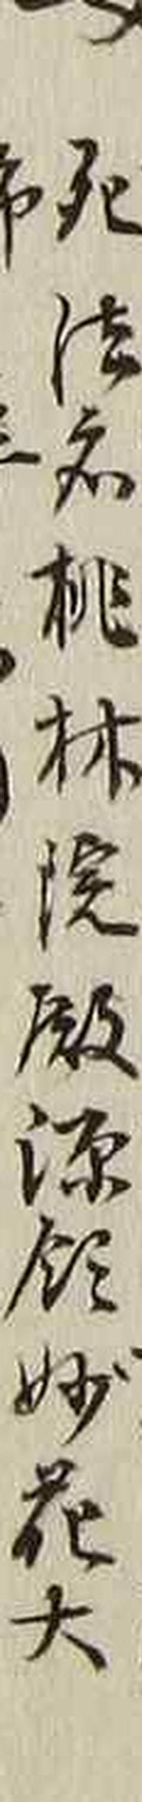死法名桃林院殿源領妙花大
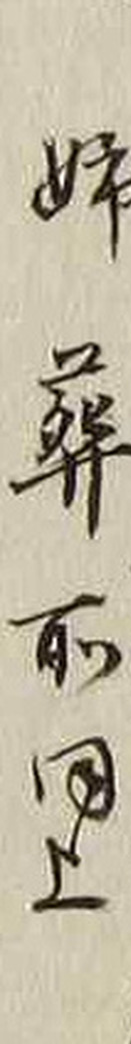姉葬所同上
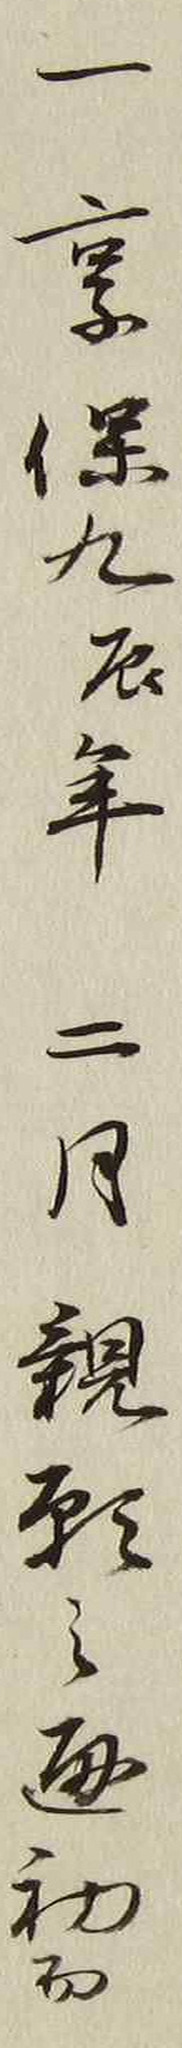一享保九辰年二月親願い之通初め
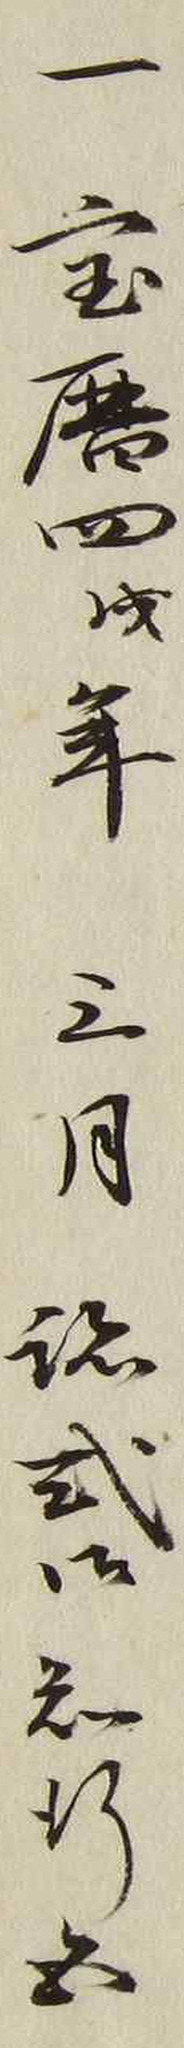一宝暦四戌年三月諸式御知行五

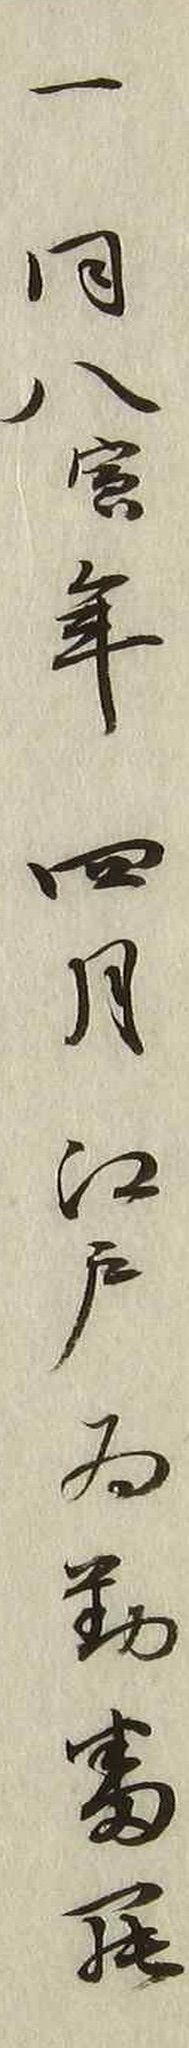一同八寅年四月江戸勤番之為罷り
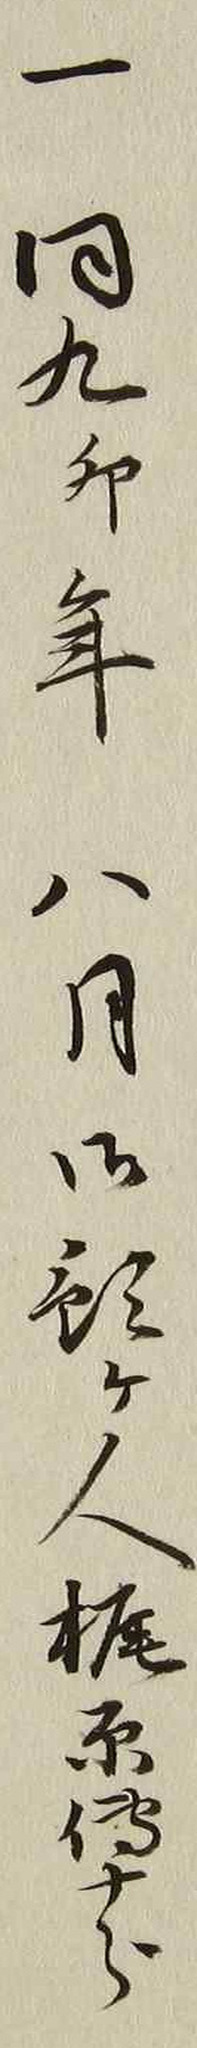一同九卯八月御預ケ人梶原傳十郎
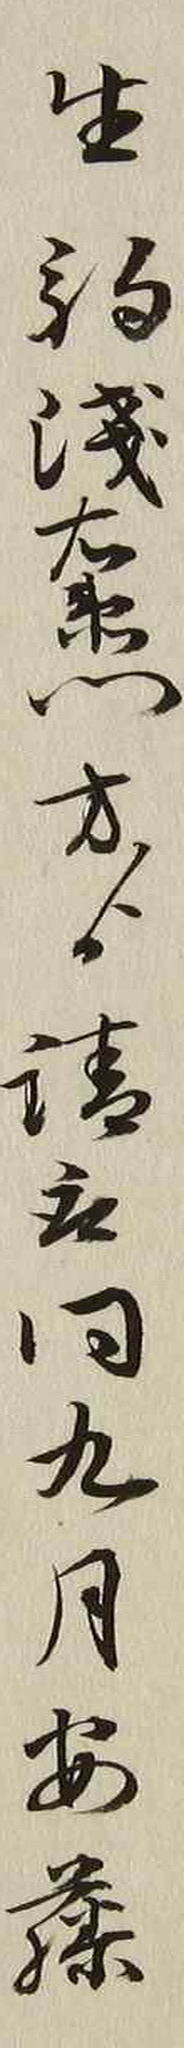生駒浅右衛門方より請け取同九月安藤
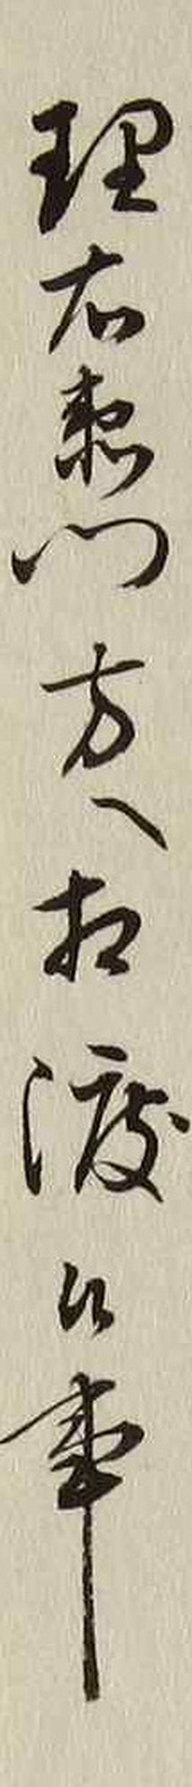理右衛門方へ相渡し候事
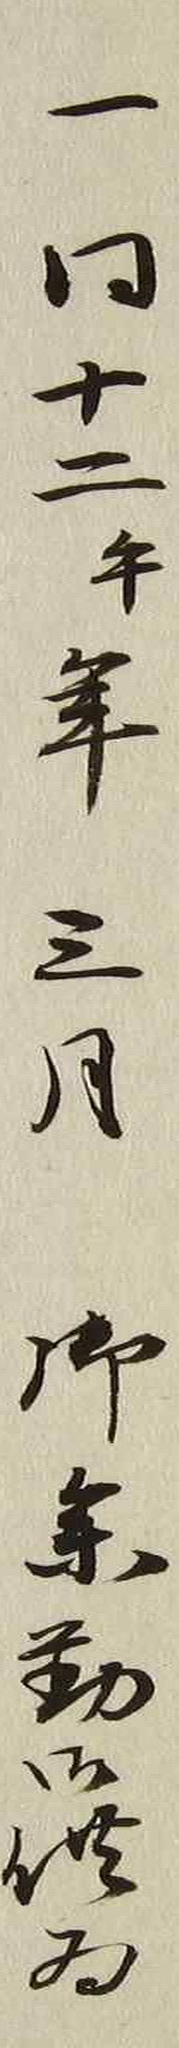一同十二午年三月御参勤御供
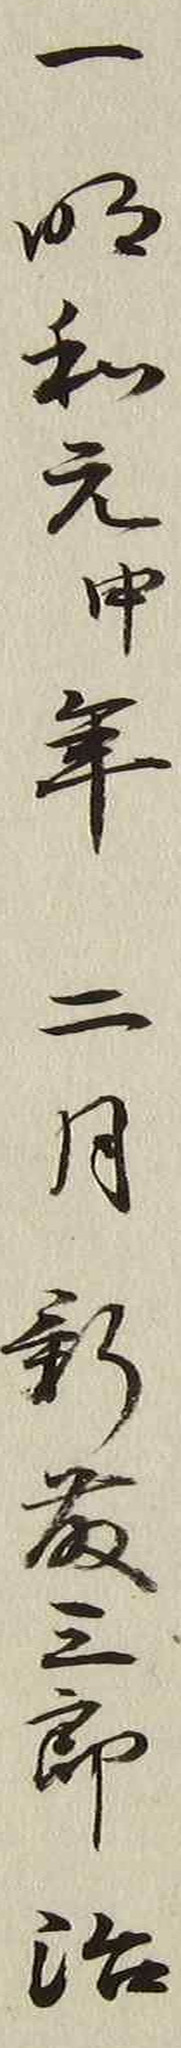一明和元申年に二月新藤三郎治
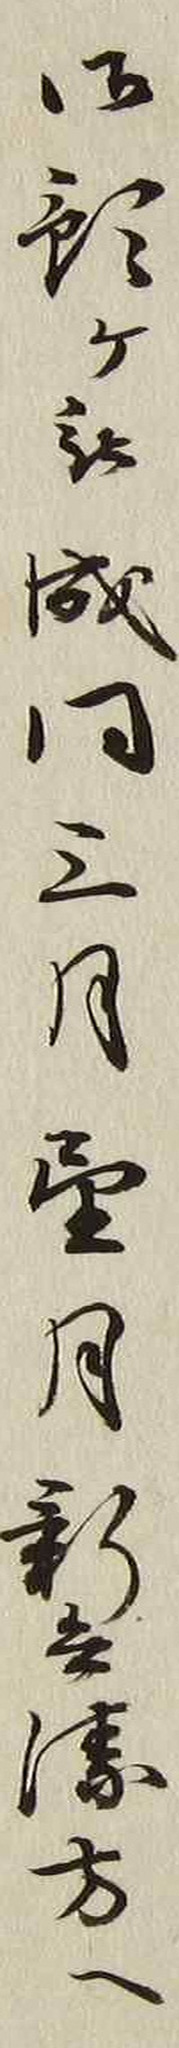御預ケ成られ同三月望月新兵衛方へ
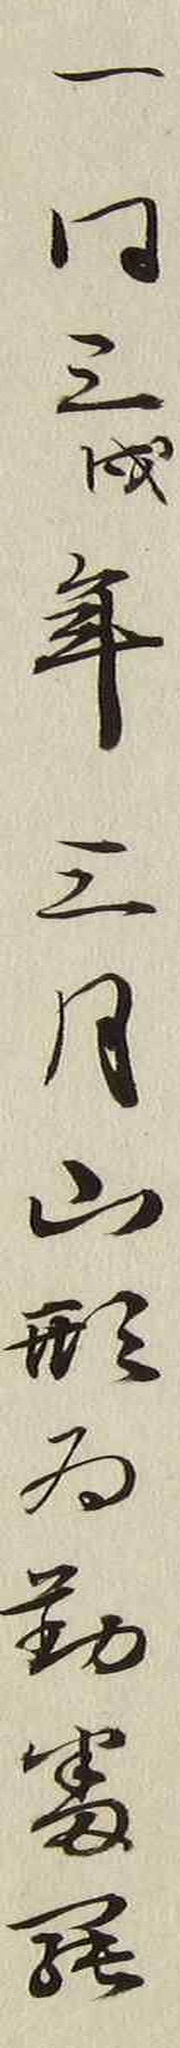一同三戌年三山形勤番之為罷り
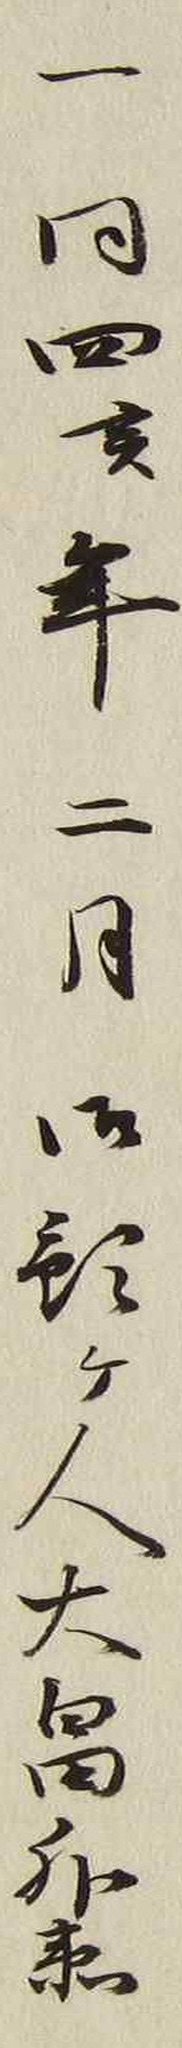一同四亥年二月御預ケ人大畠外衛

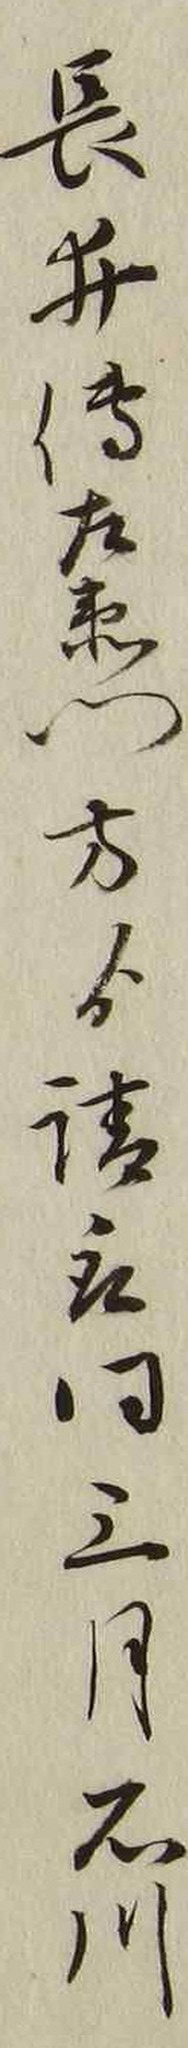長井傳左衛門方より請け取同三月石川
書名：諸士系譜　巻之16　い之部16
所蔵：会津若松市立会津図書館
